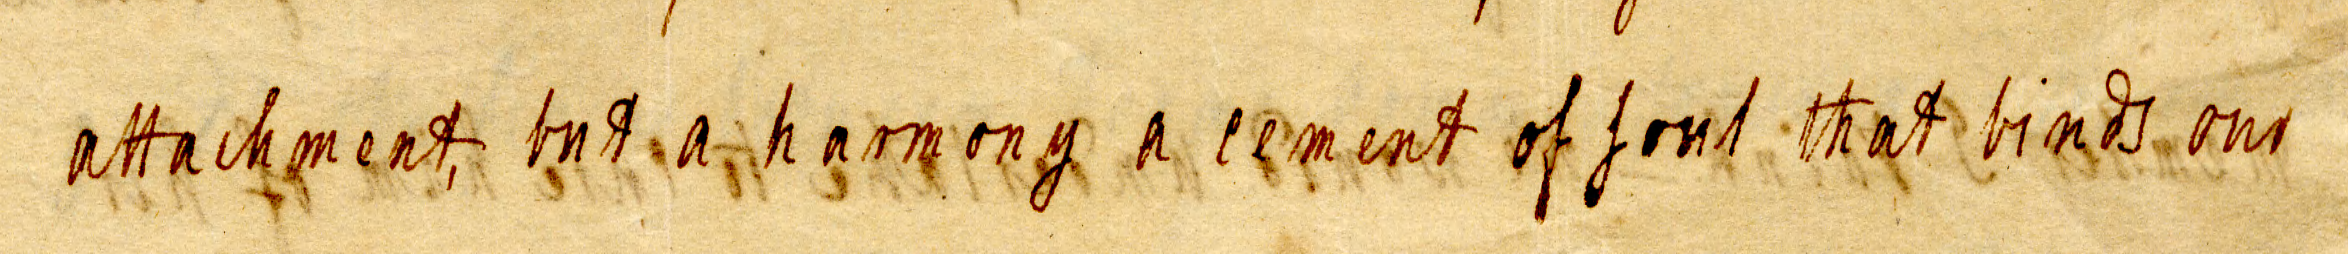attachment, but a harmony a cement of soul that binds our
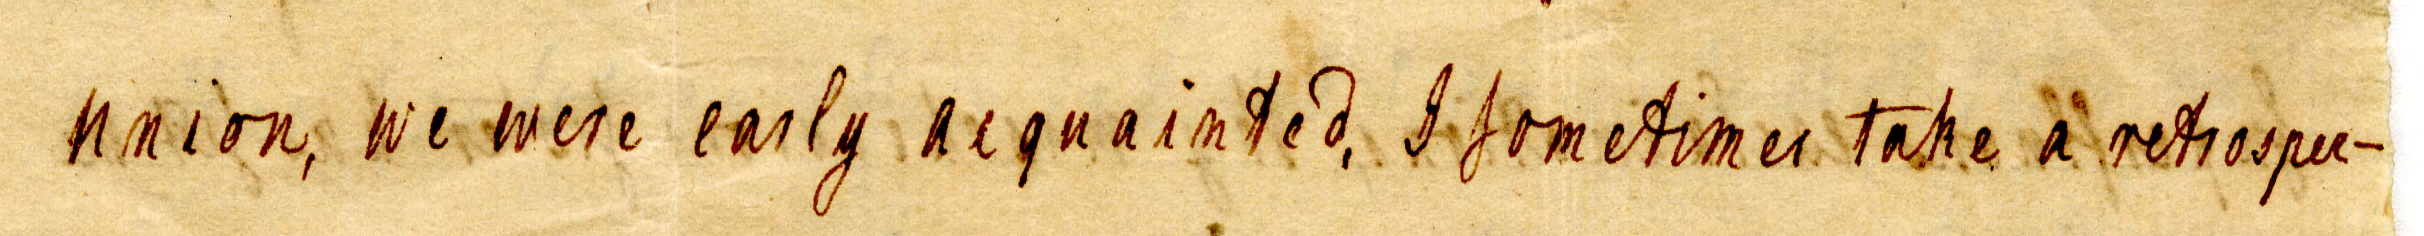union, we were early acquainted, I sometimes take a retrospec-
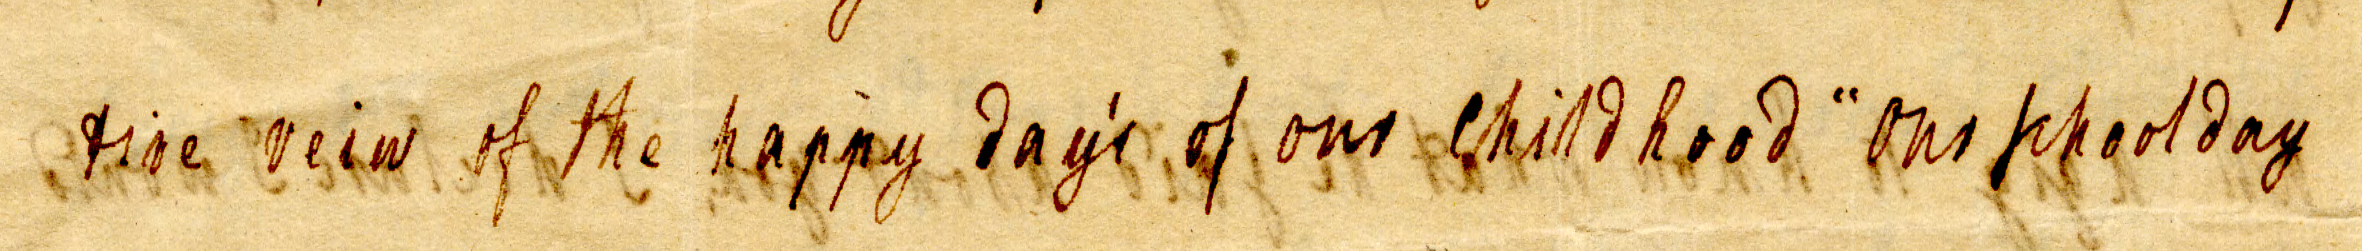tive veiw of the happy day's of our childhood "our schoolday
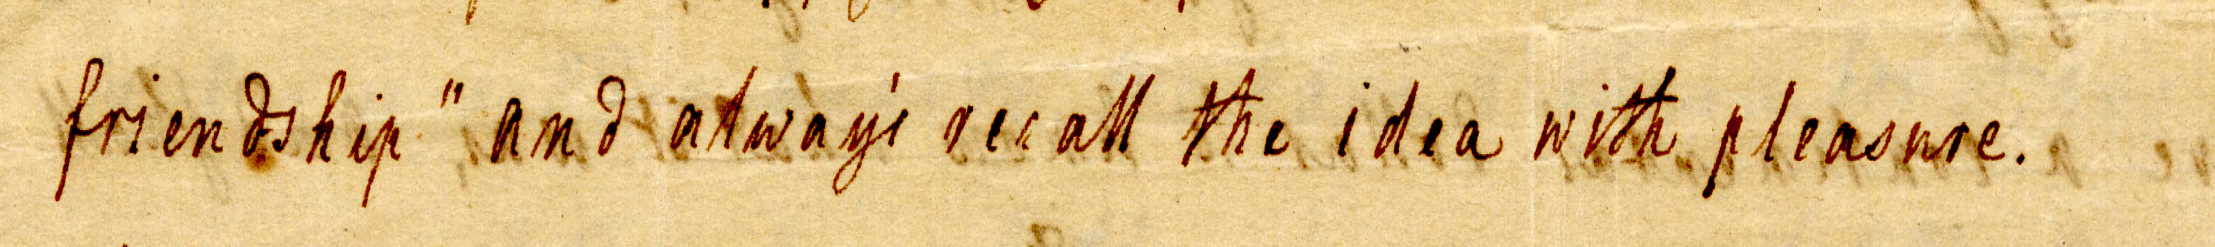friendship" and alway's recall the idea with pleasure.
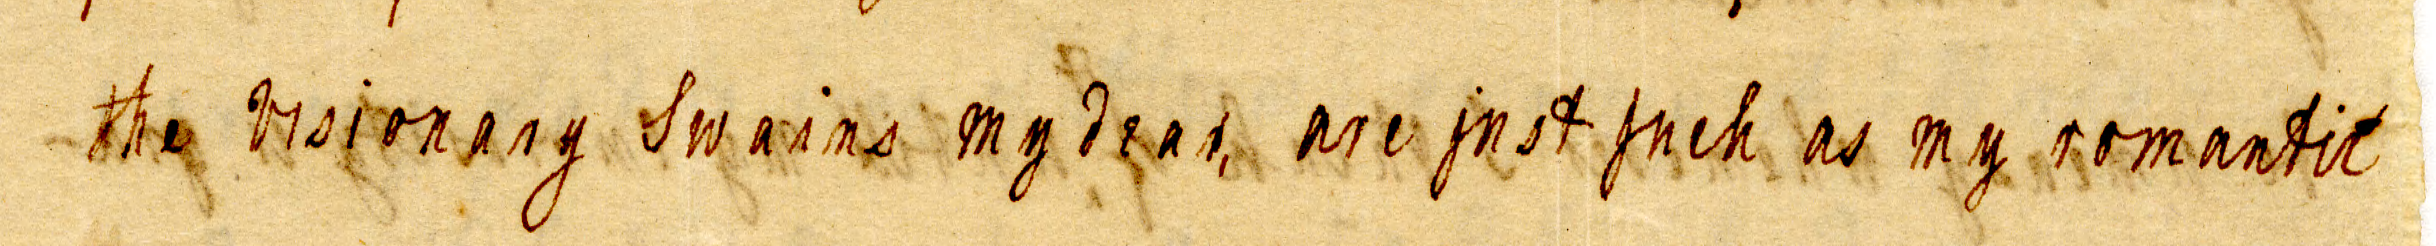the visionary swains my dear, are just such as my romantic
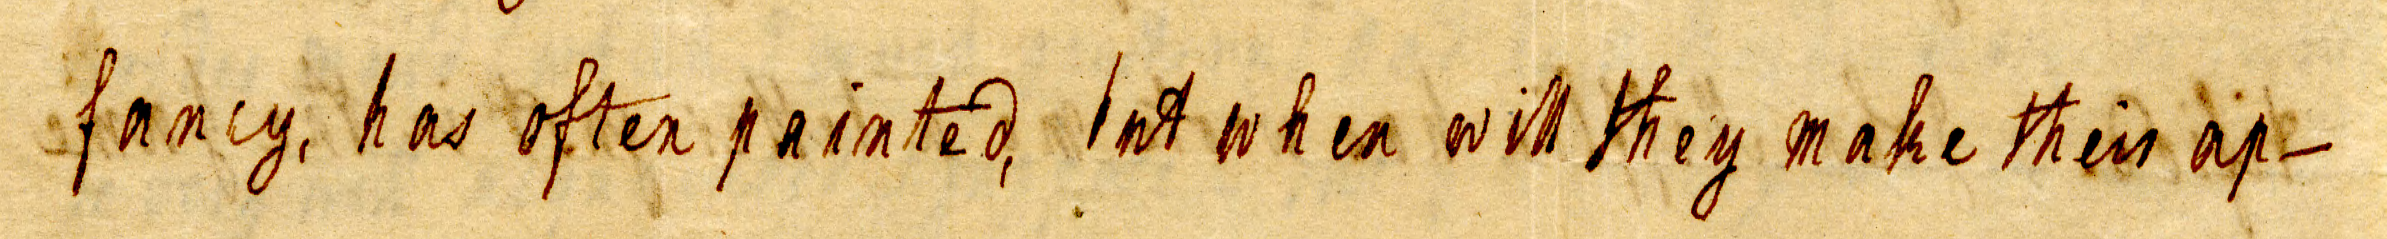fancy, has often painted, but when will they make their ap-
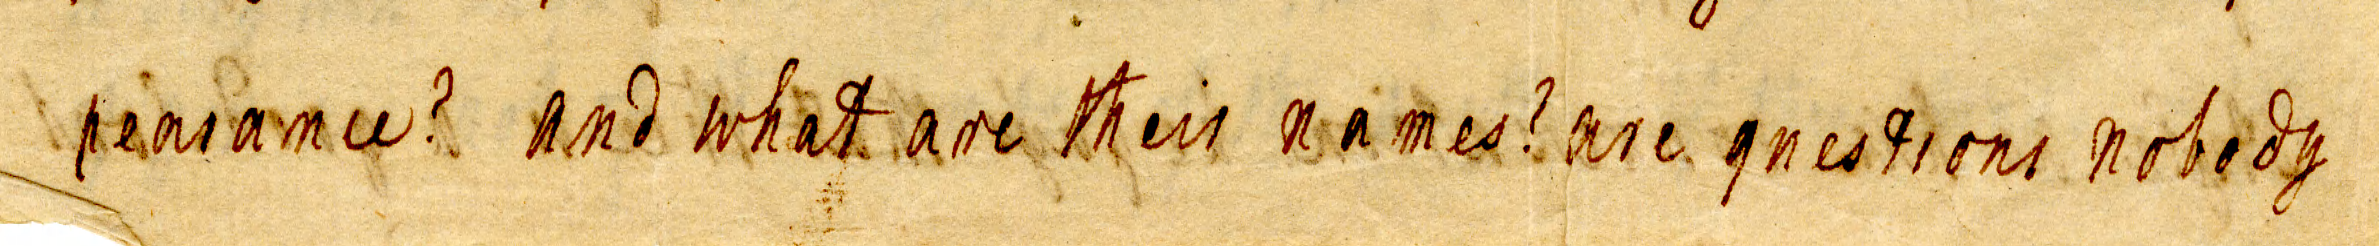pearance? and what are their names? are questions nobody
